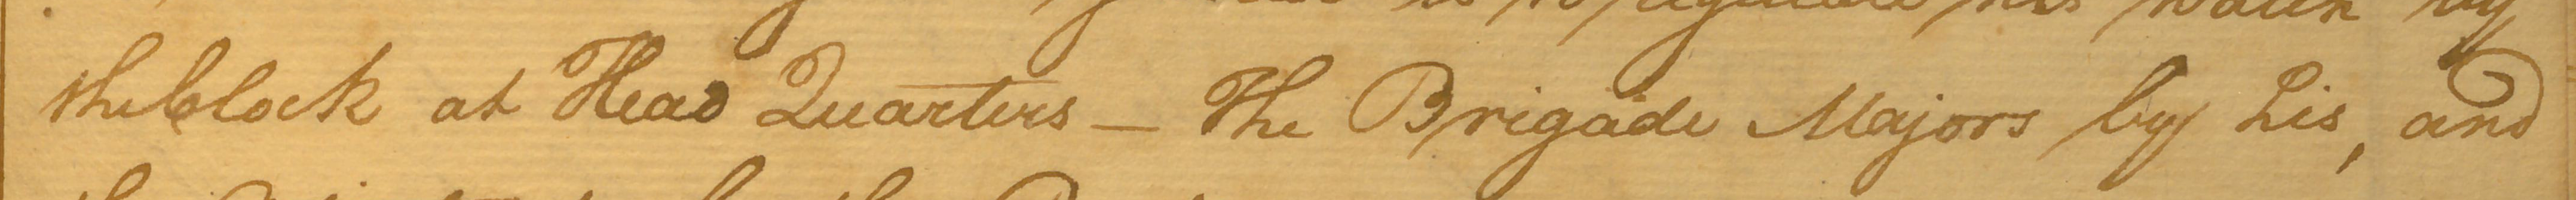the Clock at Head Quarters- The Brigade Majors by his, and
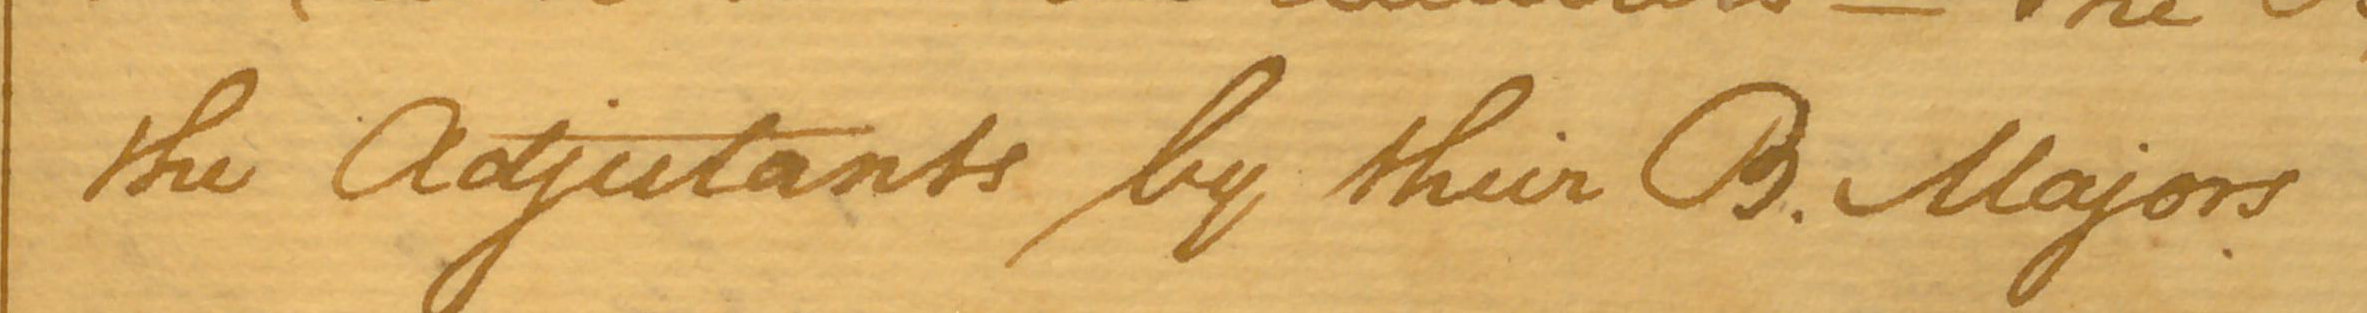the Adjutants by their B. Majors
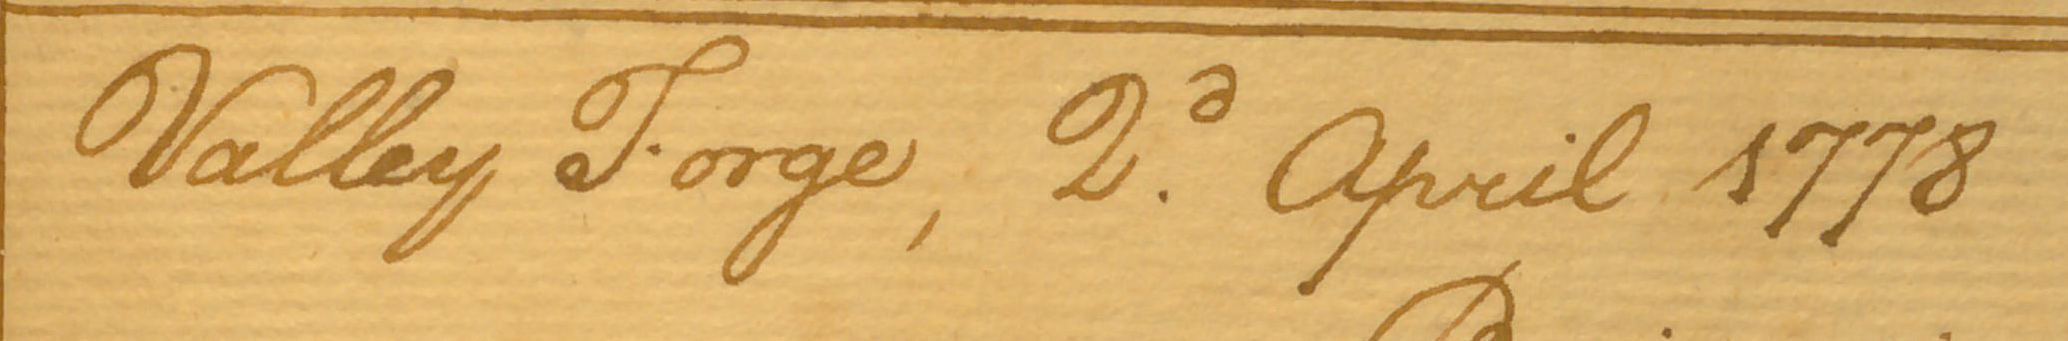Valley Forge, 2^d. April 1778
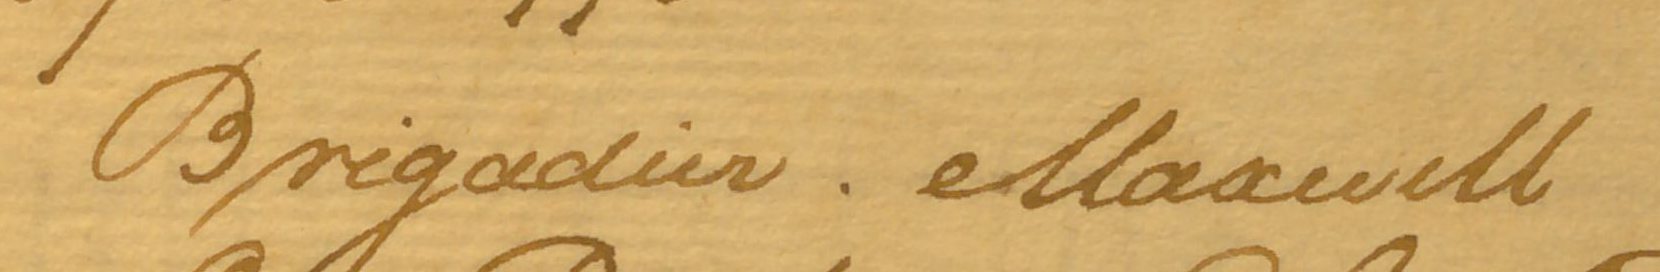Brigadier. Maxwell
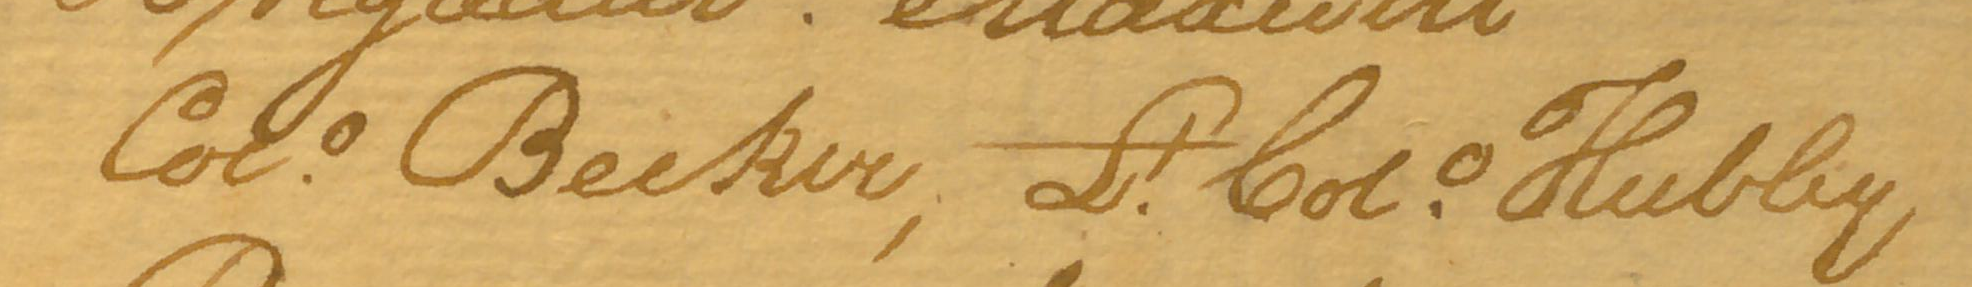Col^o. Becker, L^t. Col^o. Hubly
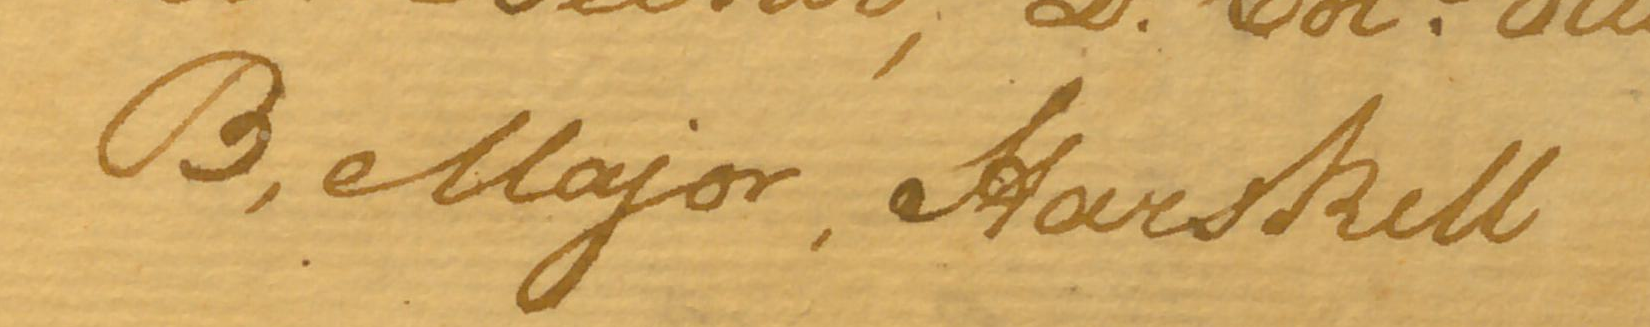B, Major, Harskill
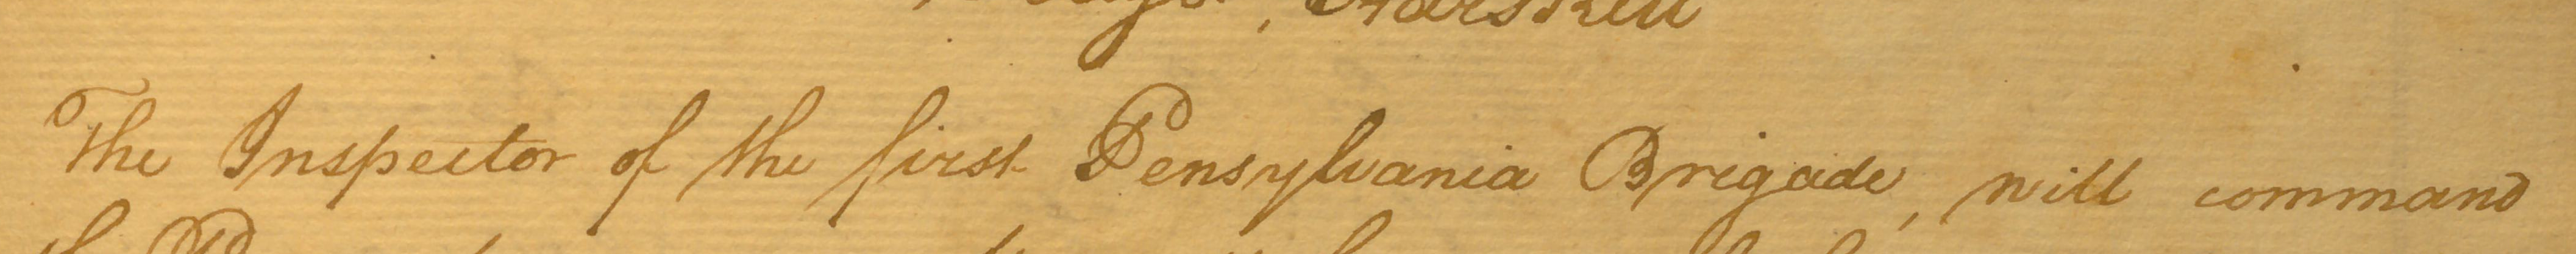The Inspector of the first Pensylvania Brigade, will command
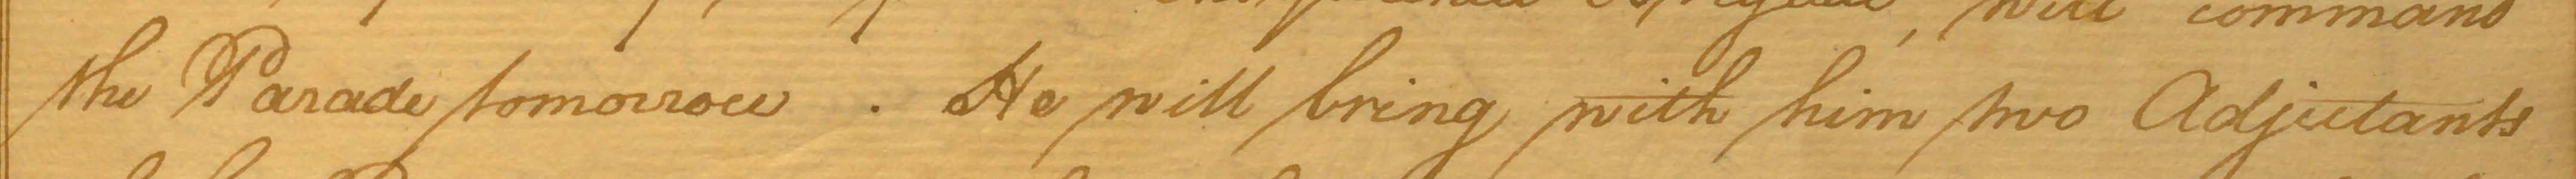the Parade tomorrow. He will bring with him two Adjutants
